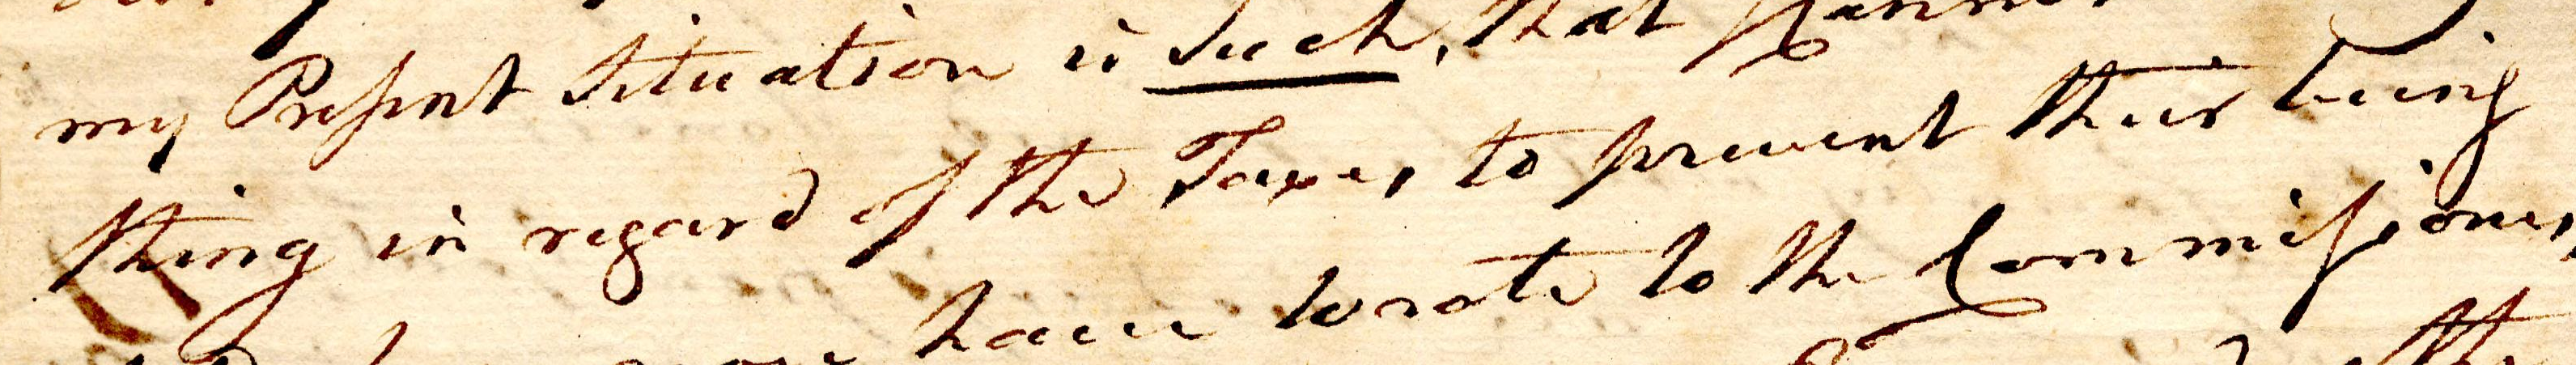thing in regard of the Taxes to prevent their being
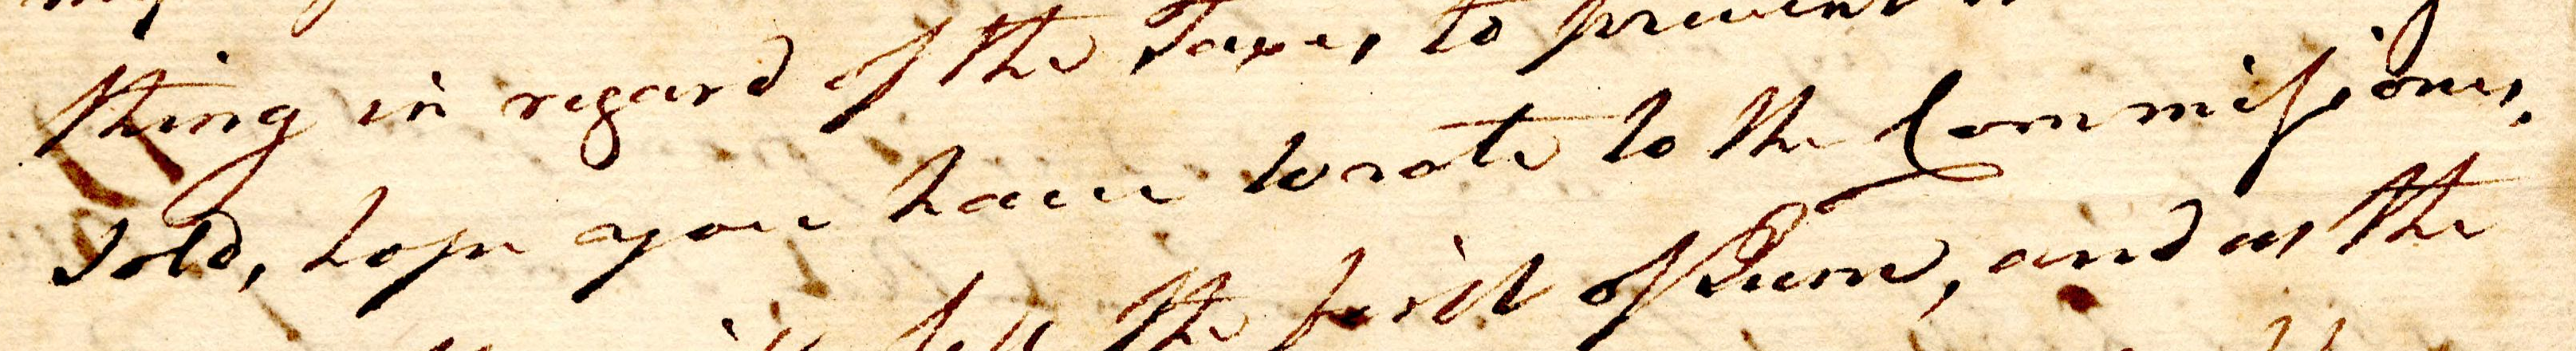sold, hope you have wrote to the Commissions
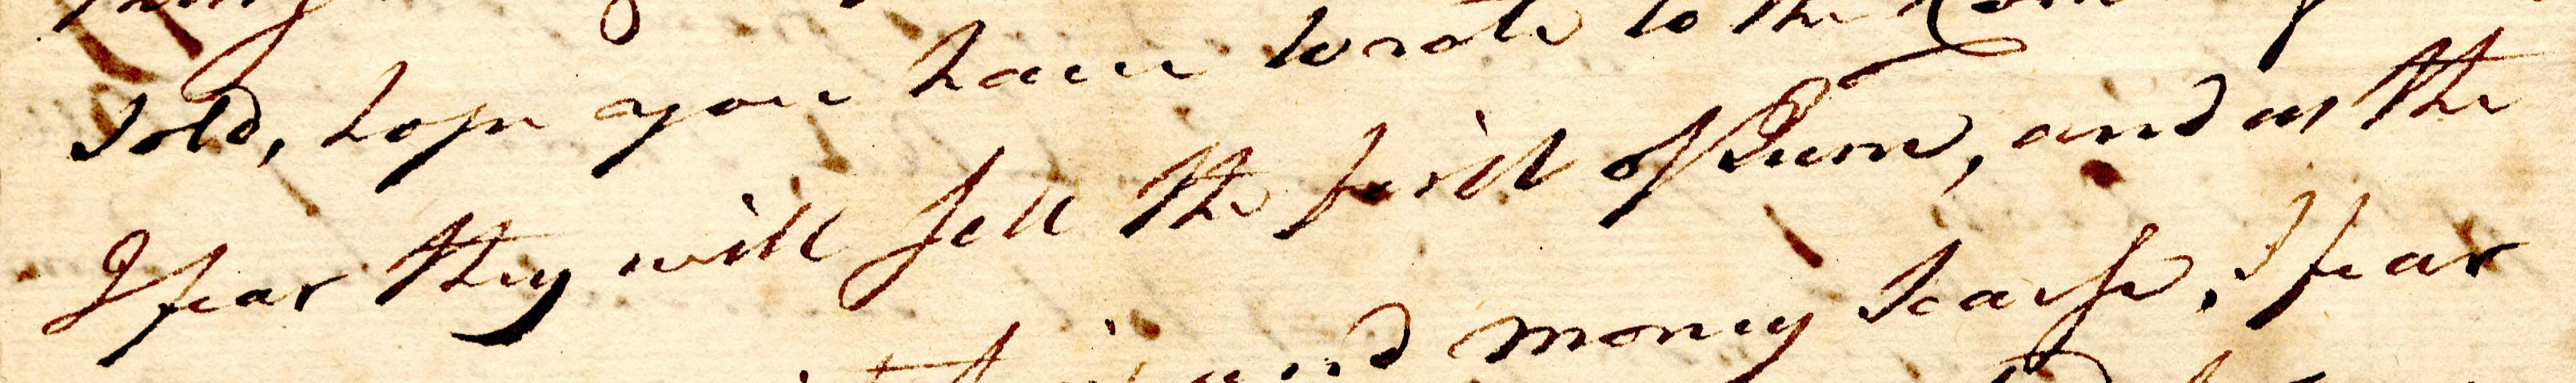I fear they will sell the first of June, and as the
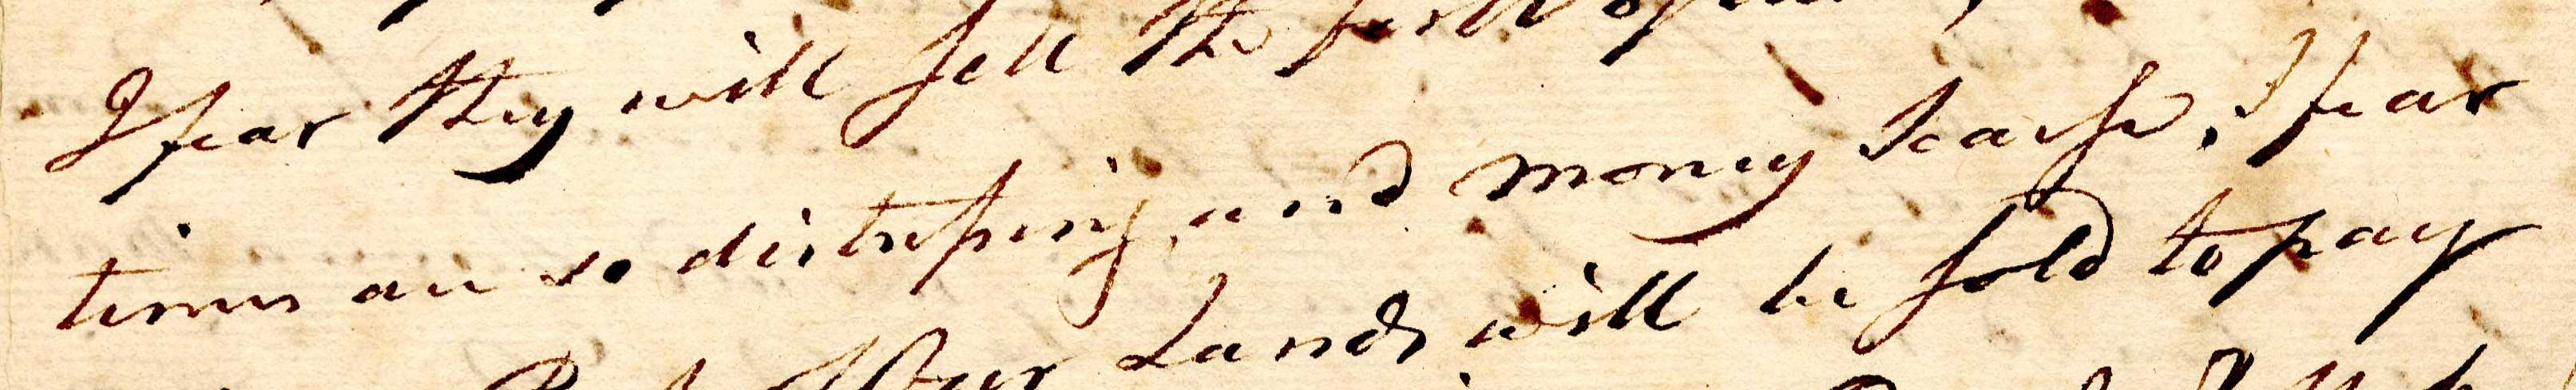times are so distressing and money Scarce, I fear
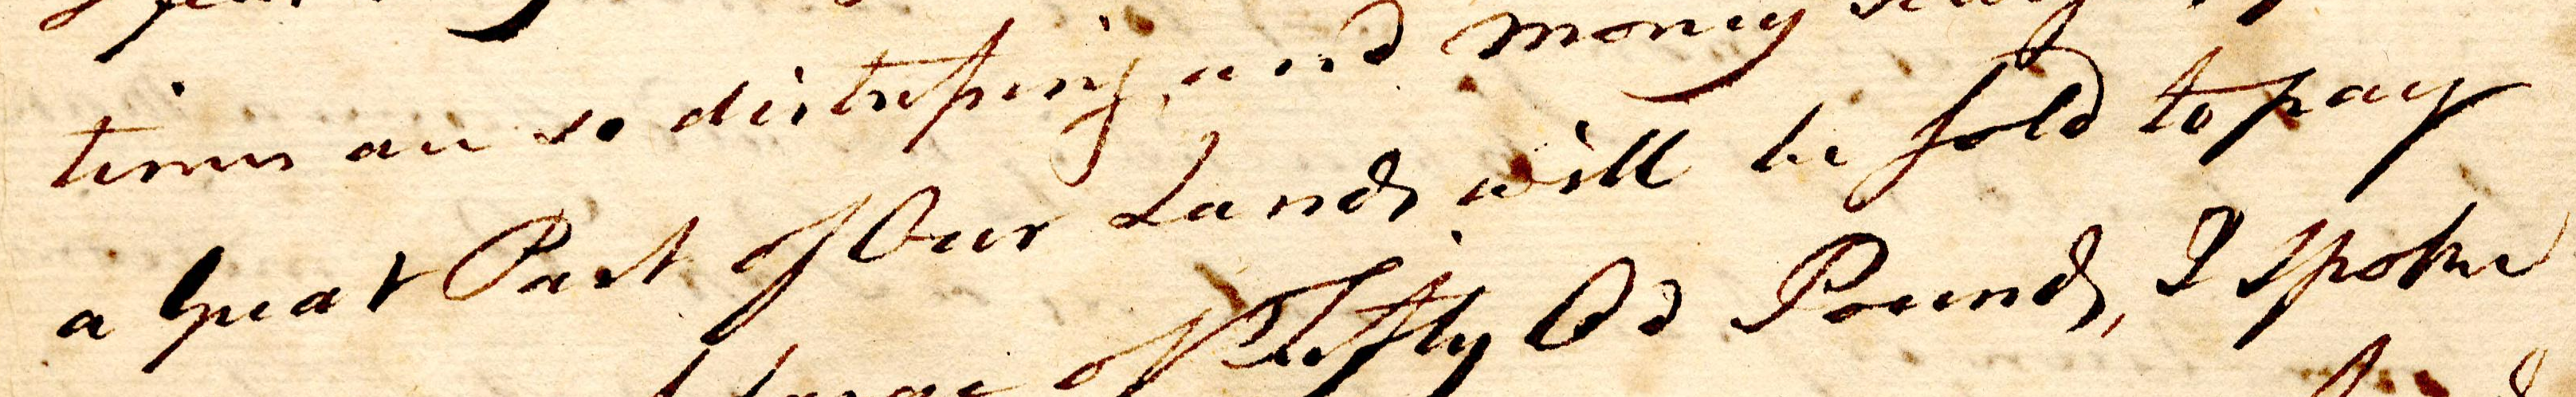a Great Part of Our Lands will be sold to pay
